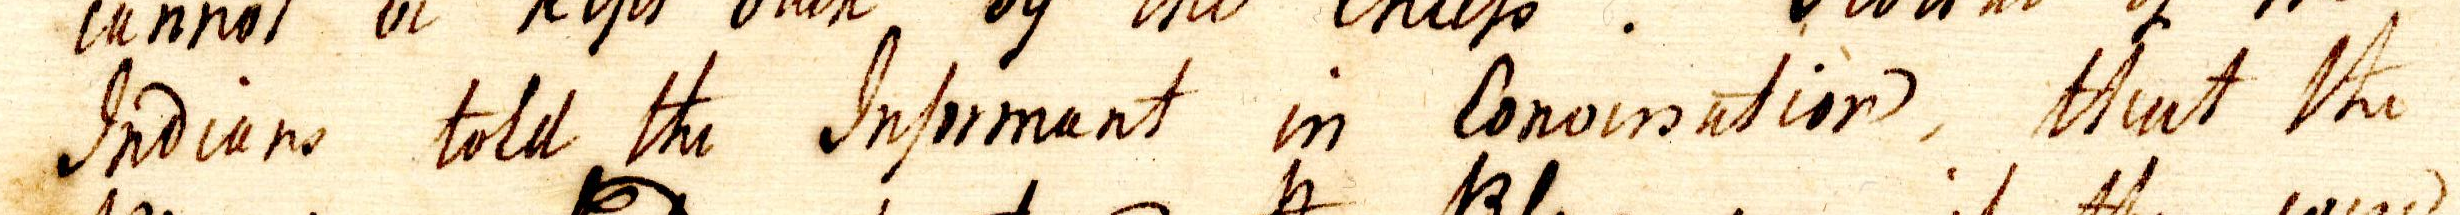Indians told the Informant in Conversation that the
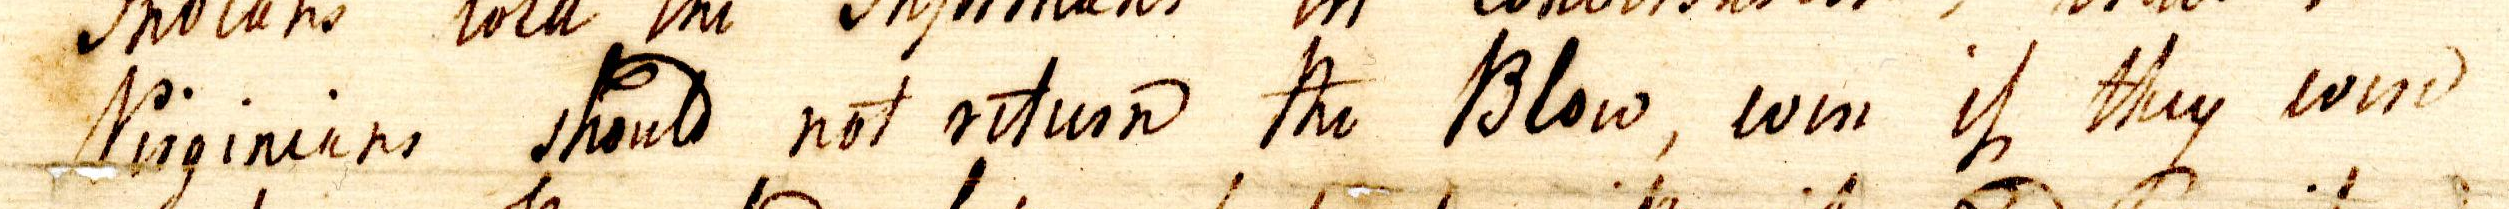Virginians should not return the Blow, even if they were
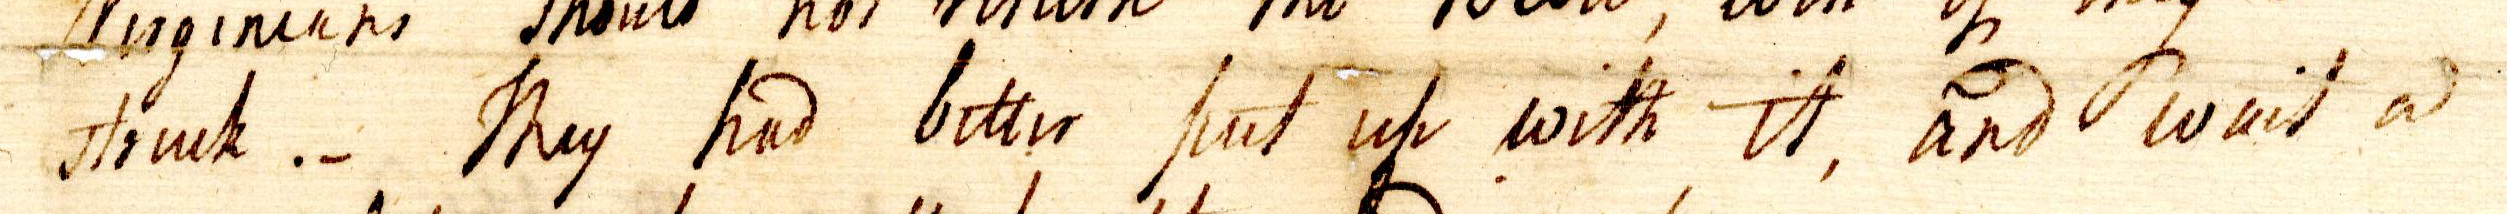struck.- They had better put up with it, and wait a
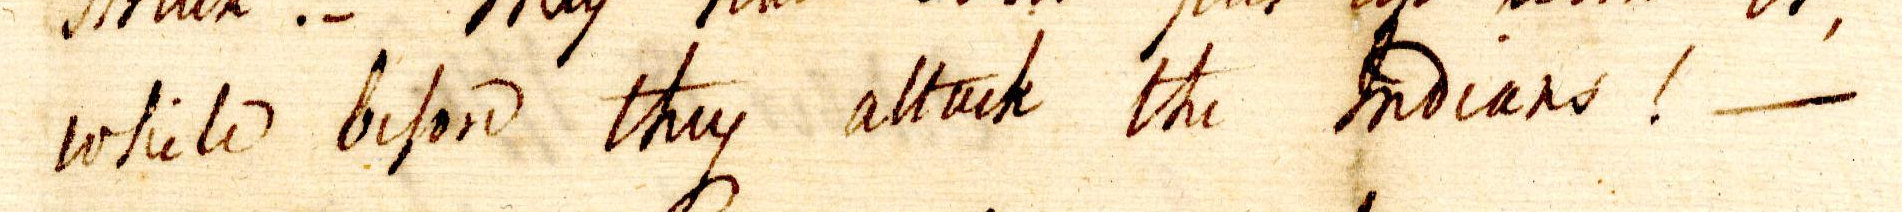while before they attack the Indians!-
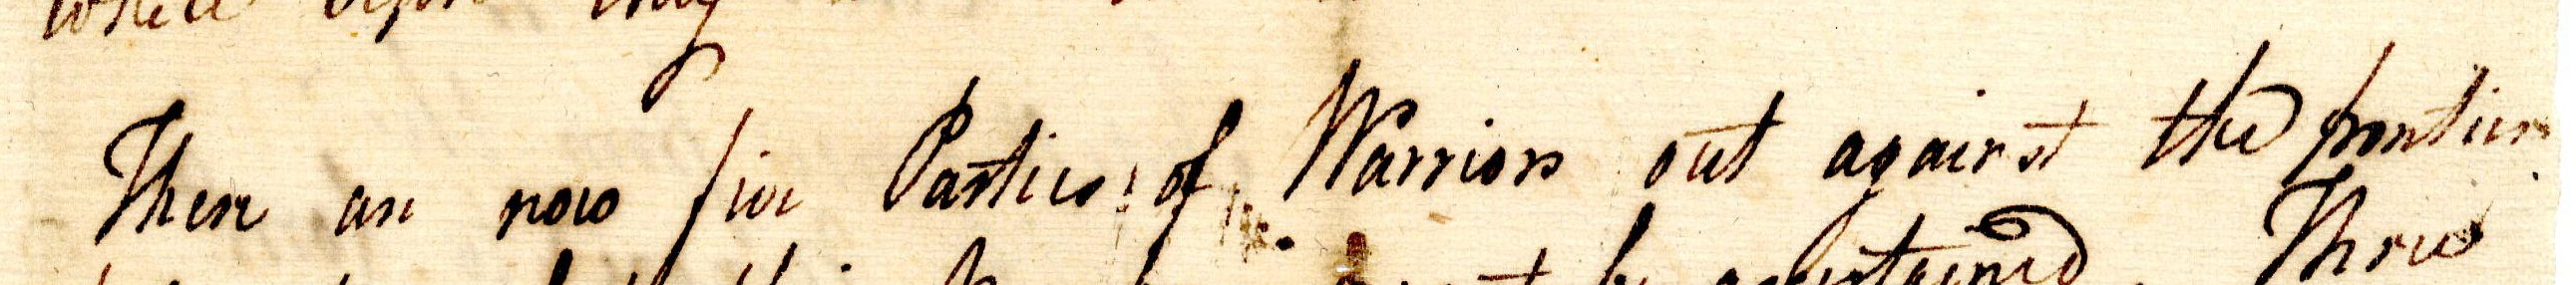There are now five Parties of Warriors out against the frontiers
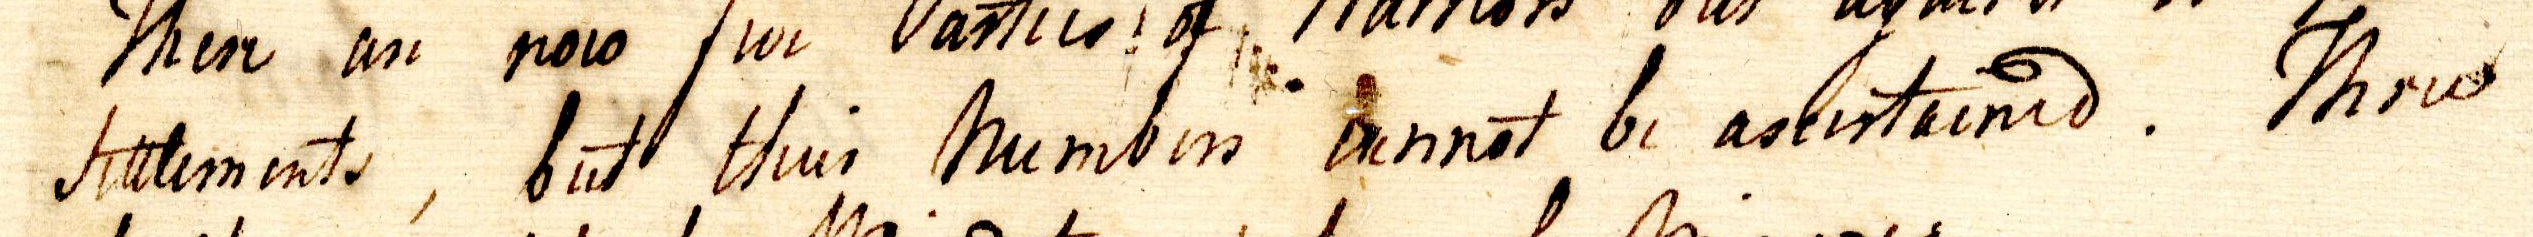Settlements, but their Numbers cannot be ascertained. Three
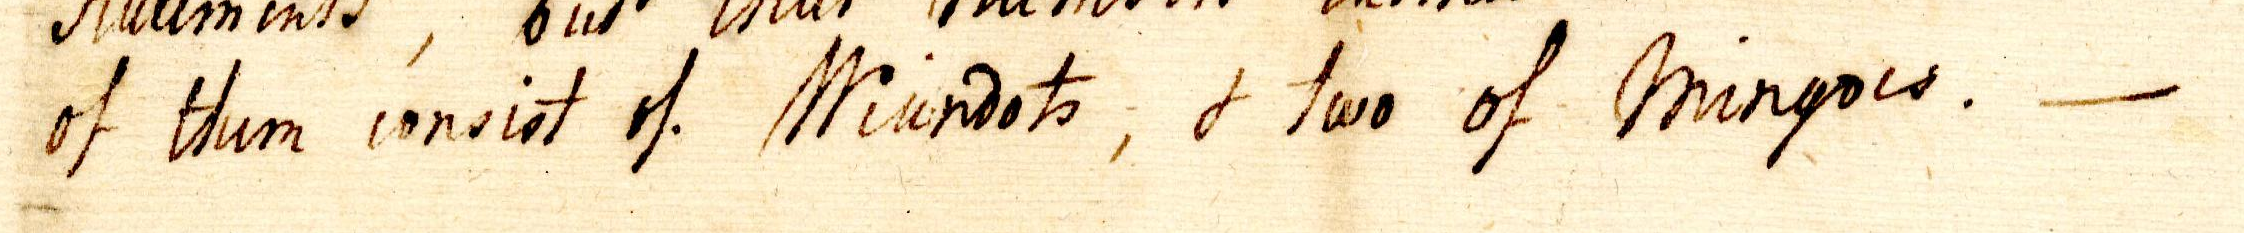of them consist of Wiandots, & two of Mingoes.-
